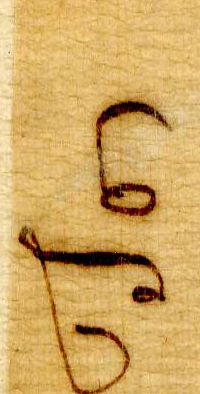To
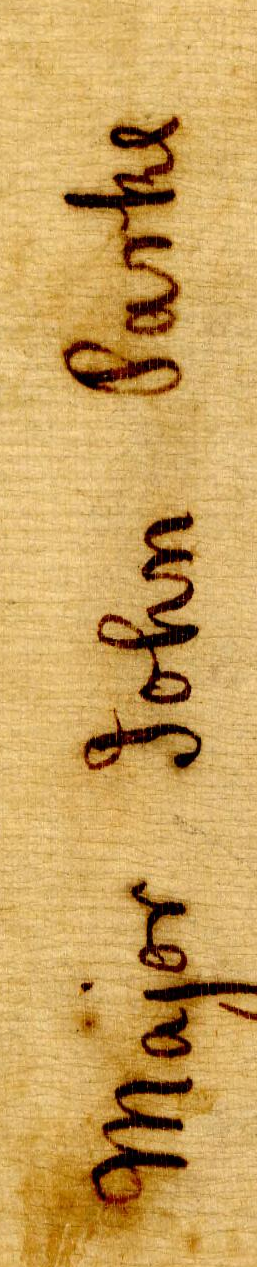Major John Parke
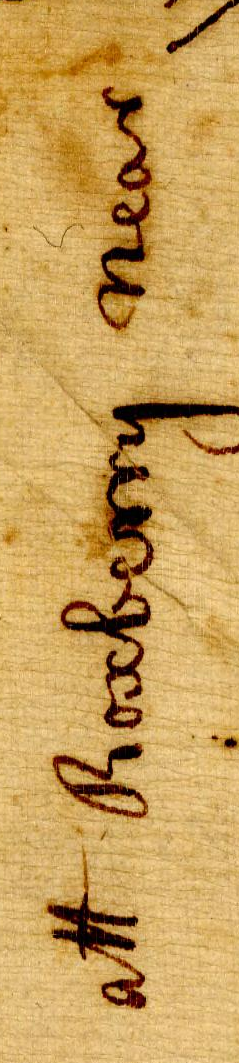att Roxberry near
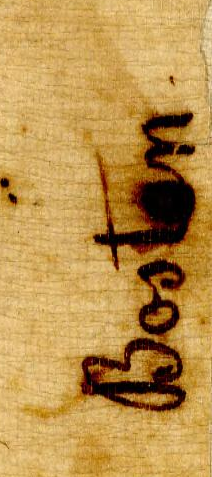Boston
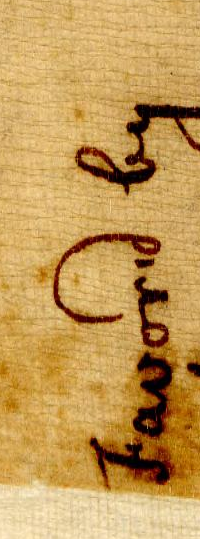Favor'd by
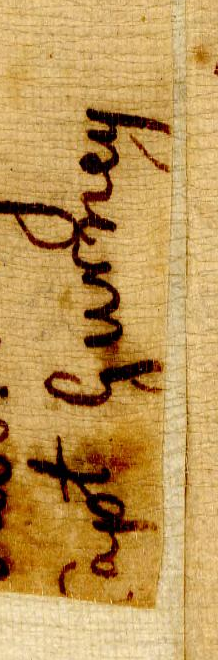Capt Gurney
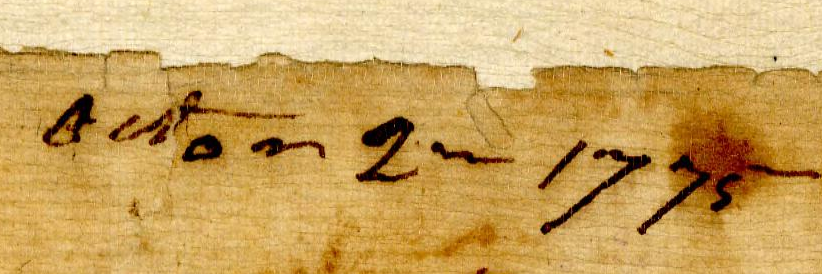Octor 2- 1775
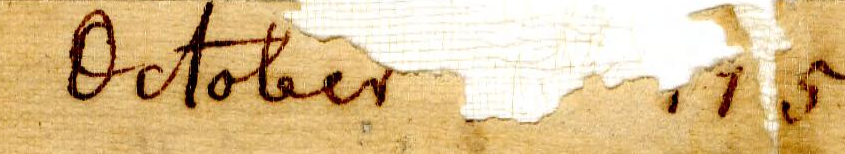October [_]75
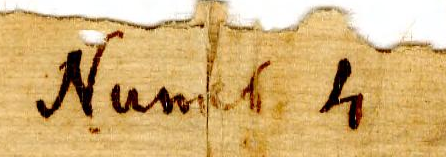Numer 4
